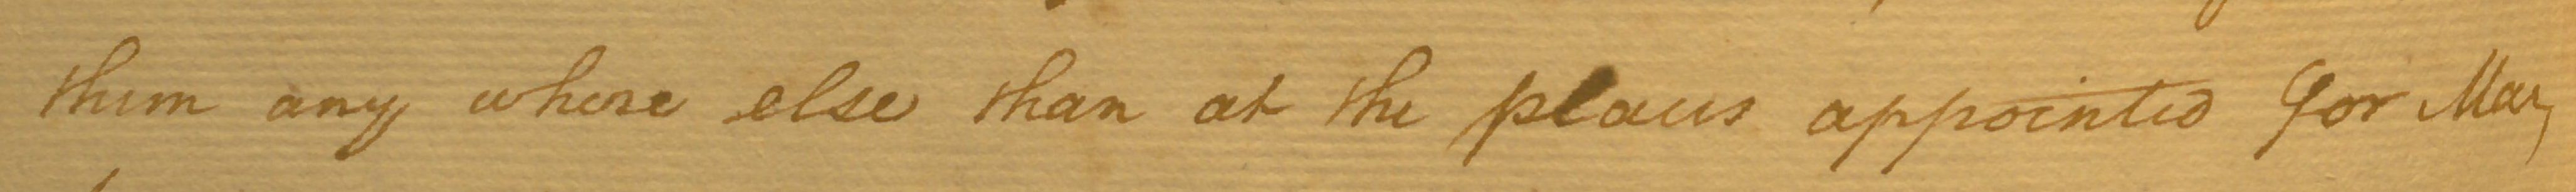them any where else than at the places appointed for Mar
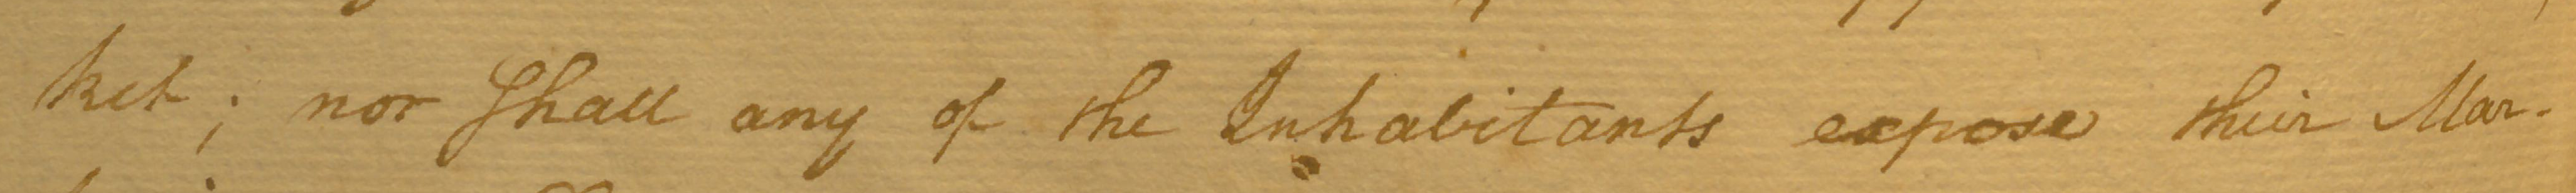ket; nor shall any of the Inhabitants expose their Mar-
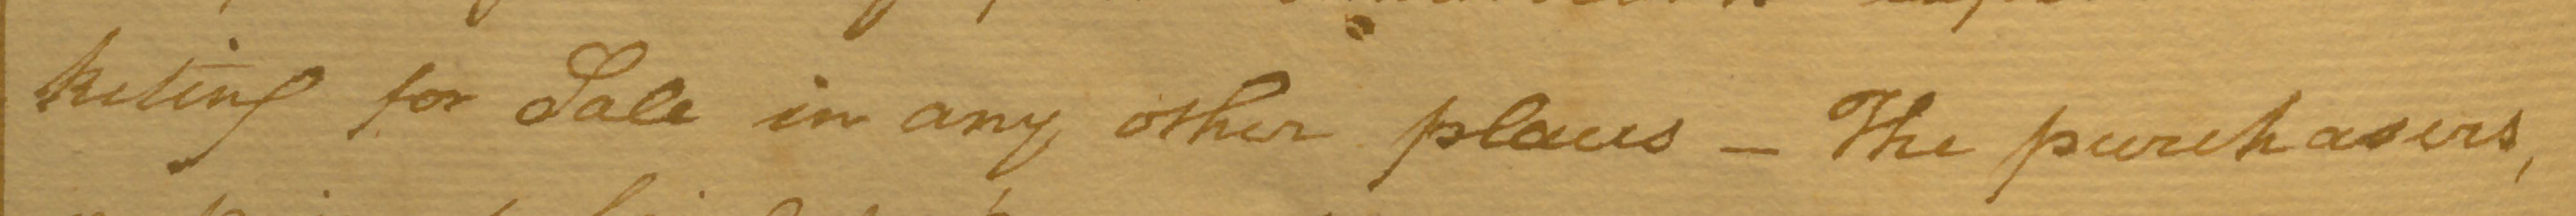keting for sale in any other places- The purchasers,
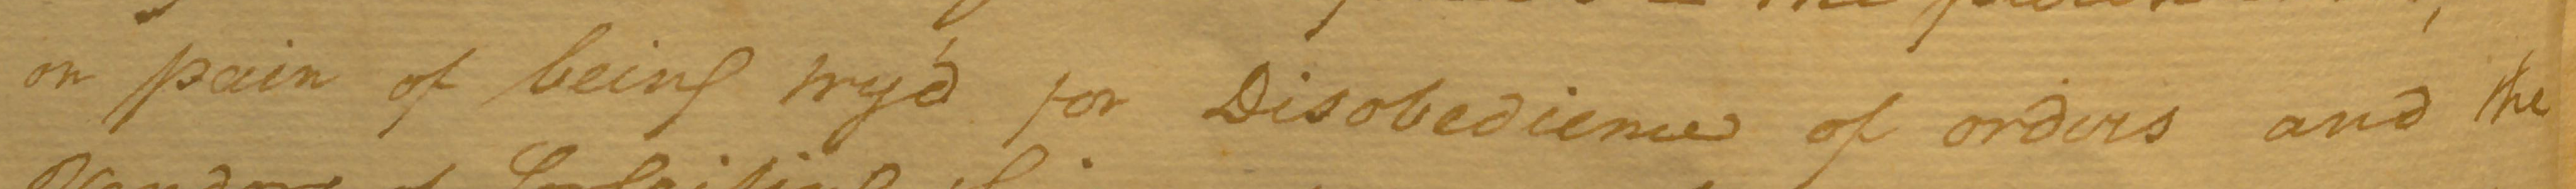on pain of being try'd for Disobedience of orders and the
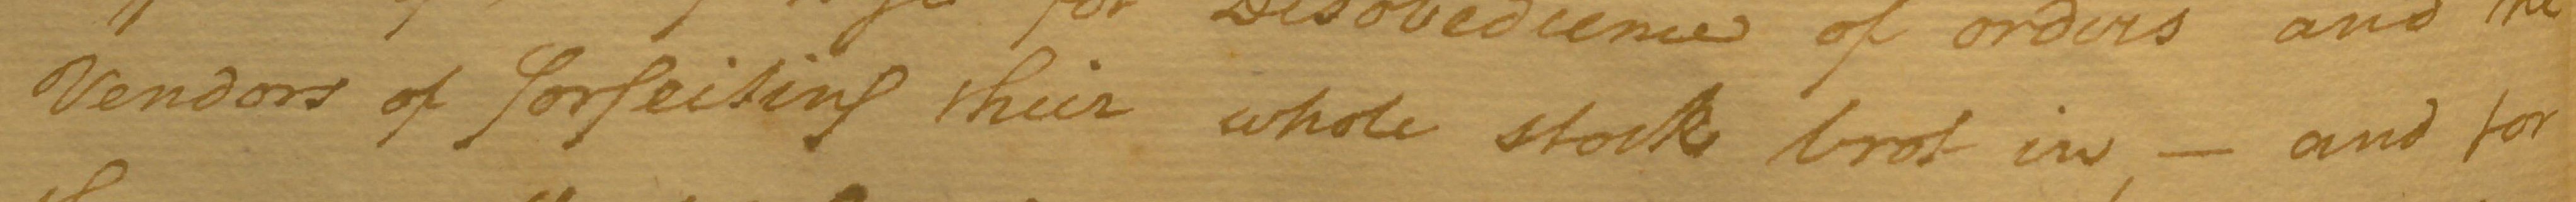vendors of forfeiting their whole stock brot in,- and for
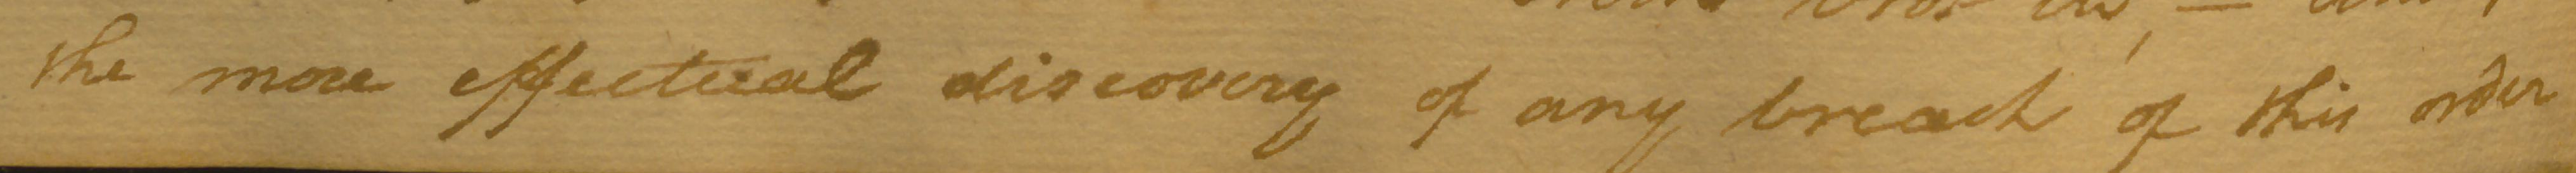the more effectual discovery of any breach of this order
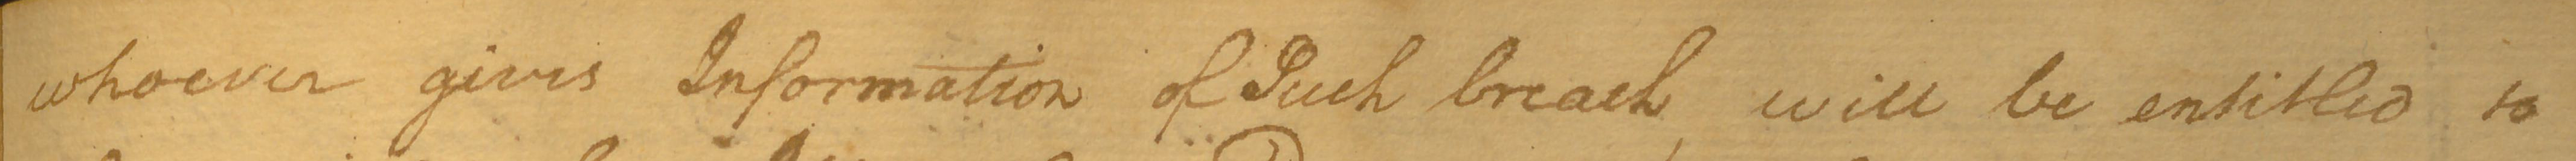whoever gives Information of such breach will be entitled to
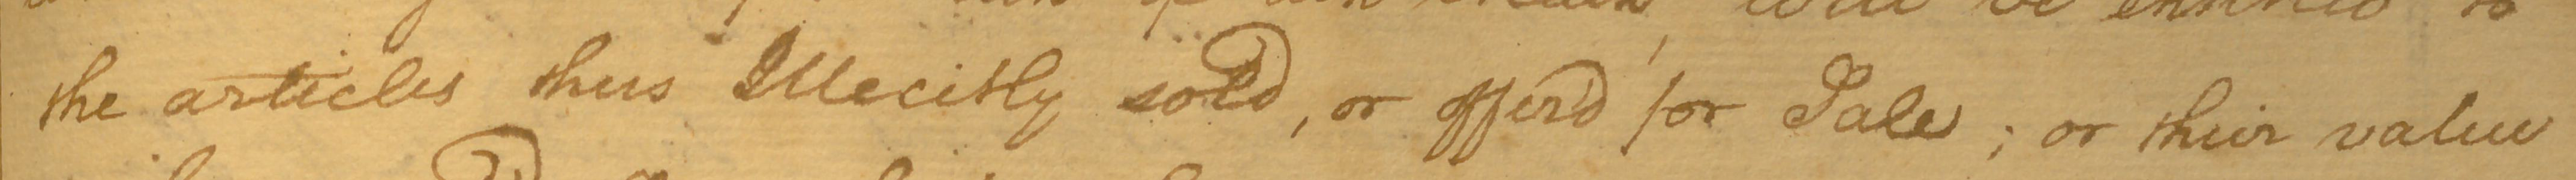the articles thus Illecitly sold, or offer'd for sale; or their value
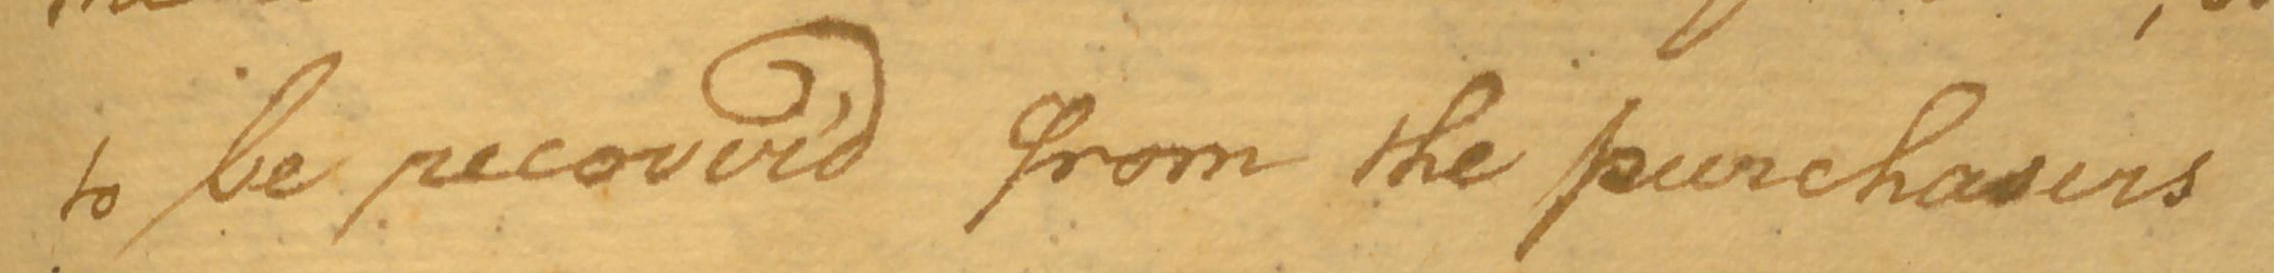to be recover'd from the purcahsers
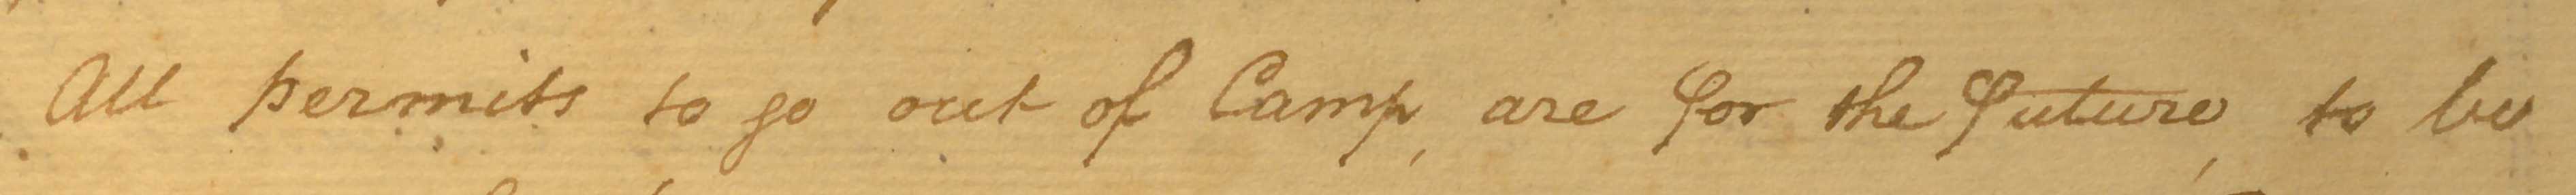All permits to go out of Camp are for the future to be
